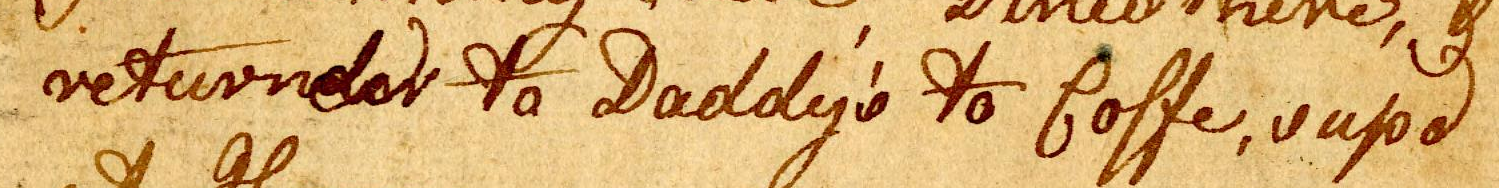returned to Daddy's to Coffe, supd
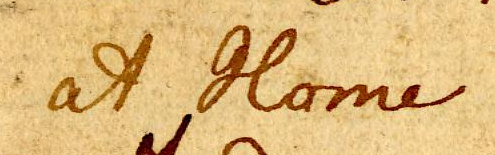at Home -
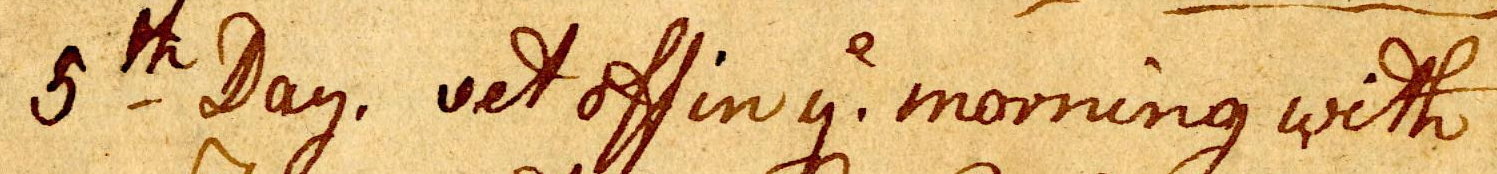5^th Day. set off in y^e. morning with
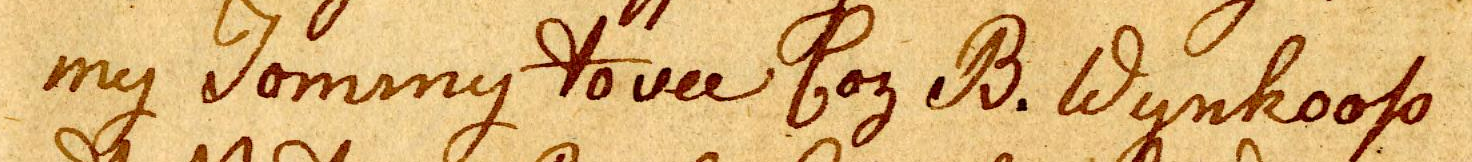my Tommy to see Coz. B Wynkoop
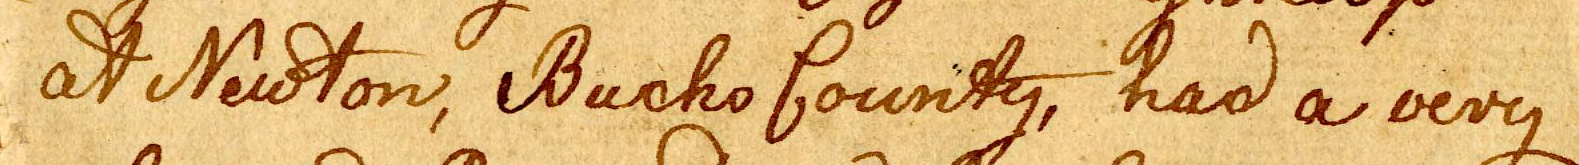at Newton, Bucks County, had a very
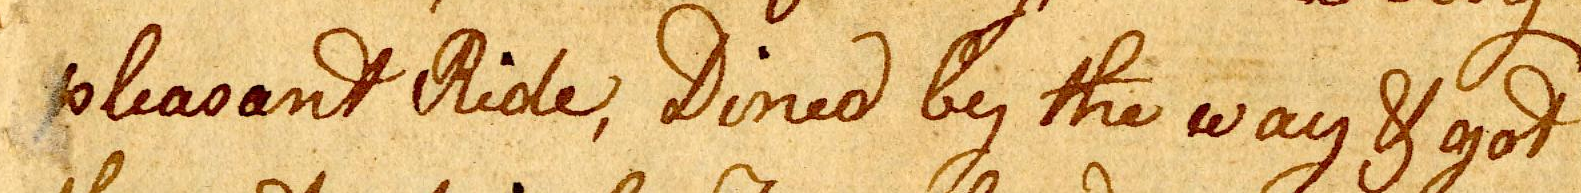pleasant Ride, Dined by the way & got
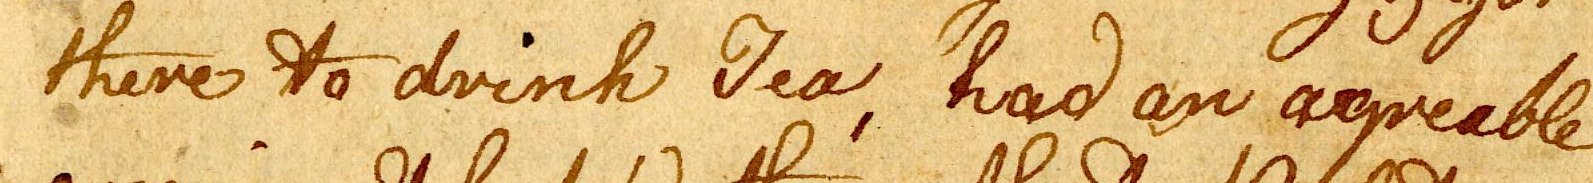there to drink Tea, had an agreable
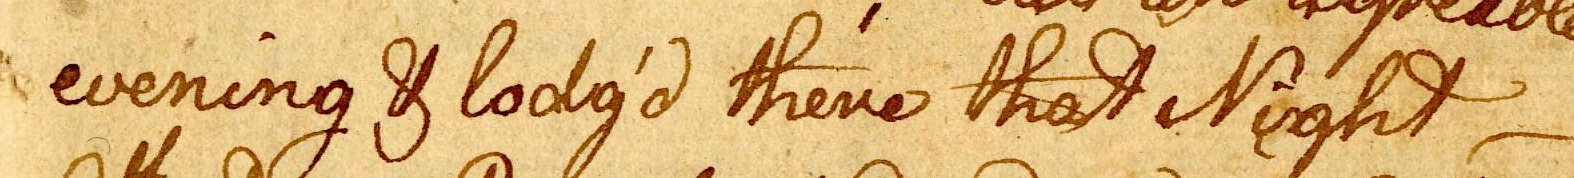evening & lodg'd there that Night-
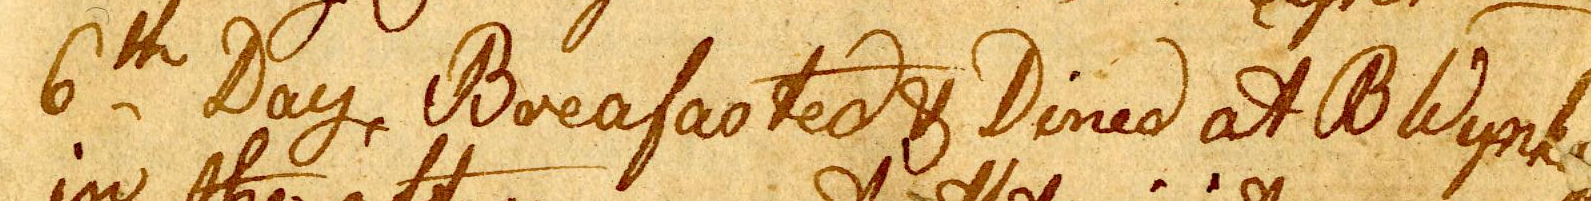6^th Day, Breafasted & Dined at B Wynk
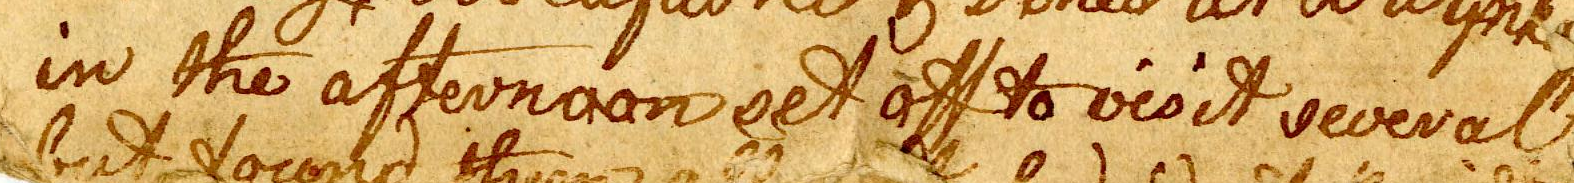in the afternoon set off to visit several
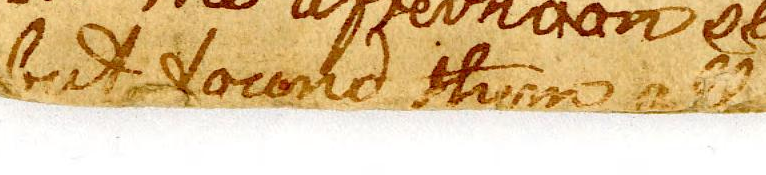but found them all
